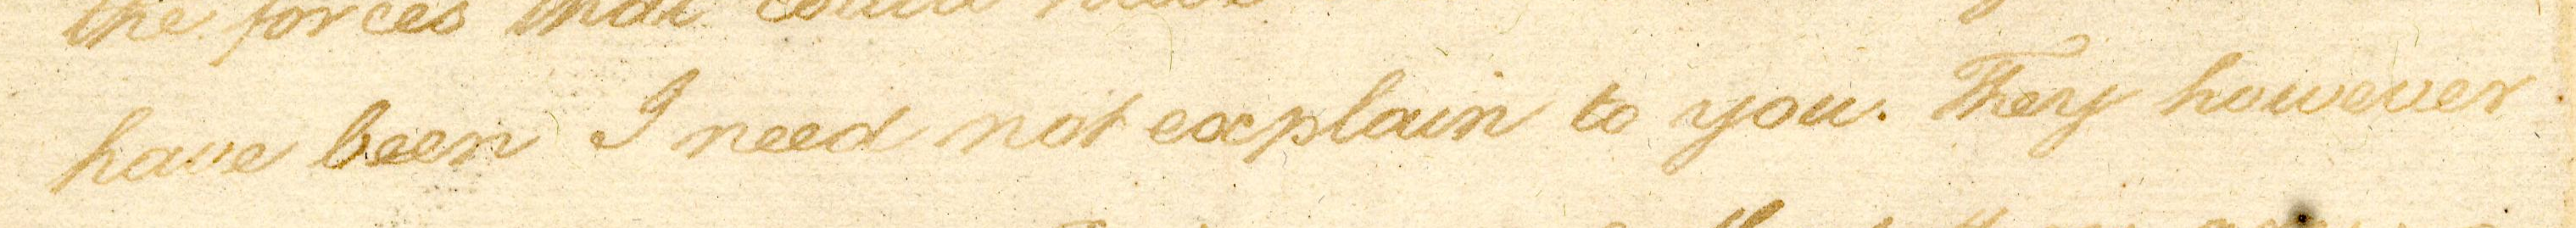have been I need not explain to you. They however
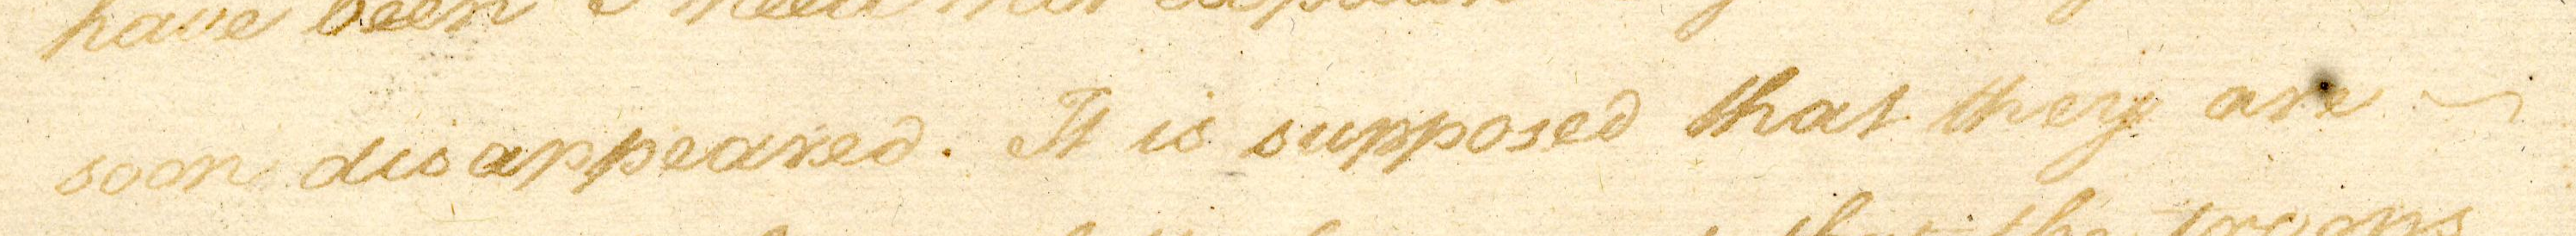soon disappeared. It is supposed that they are-
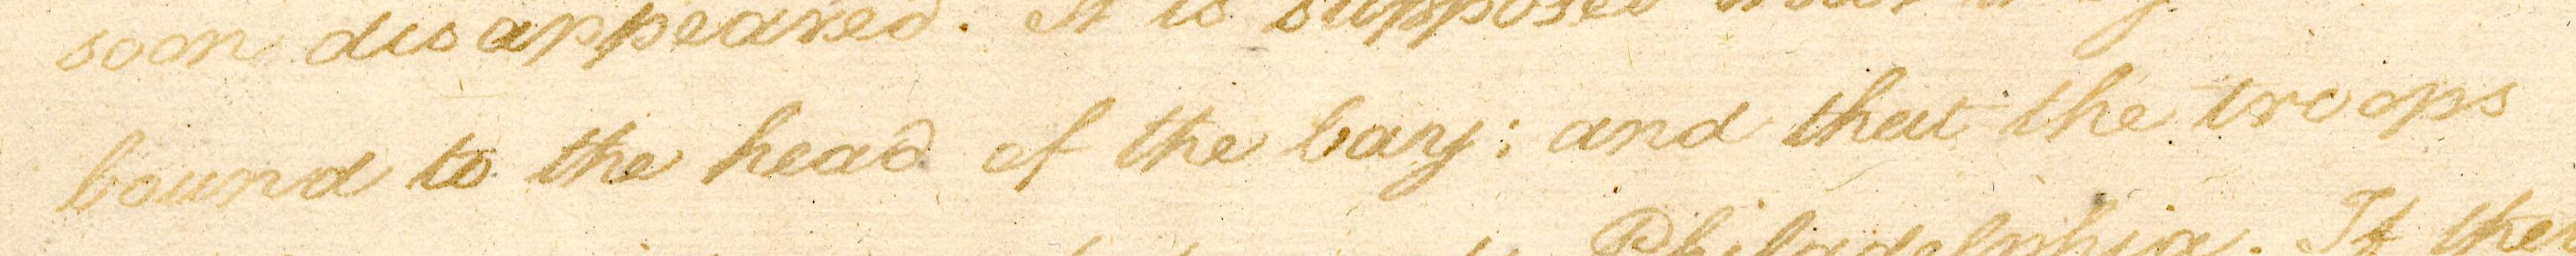bound to the head of the bay; and that the troops
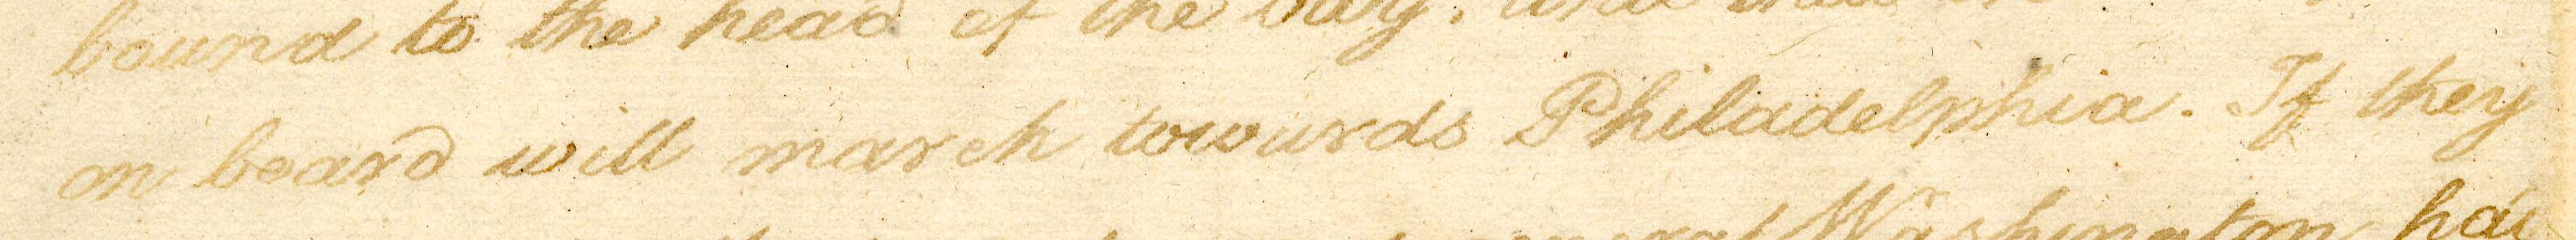on board will march towards Philadelphia. If they
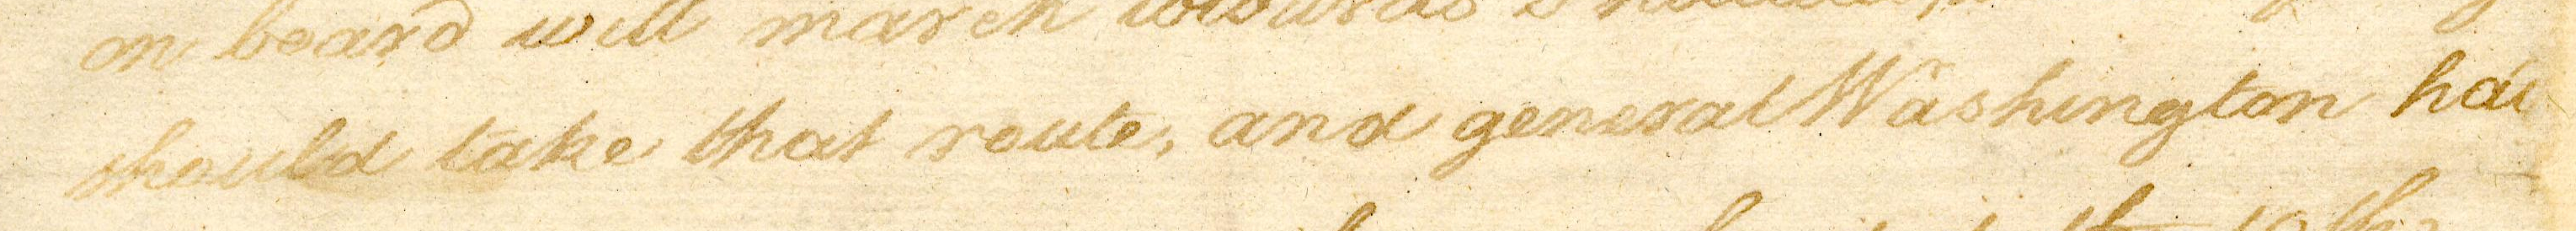should take that route, and general Washington had
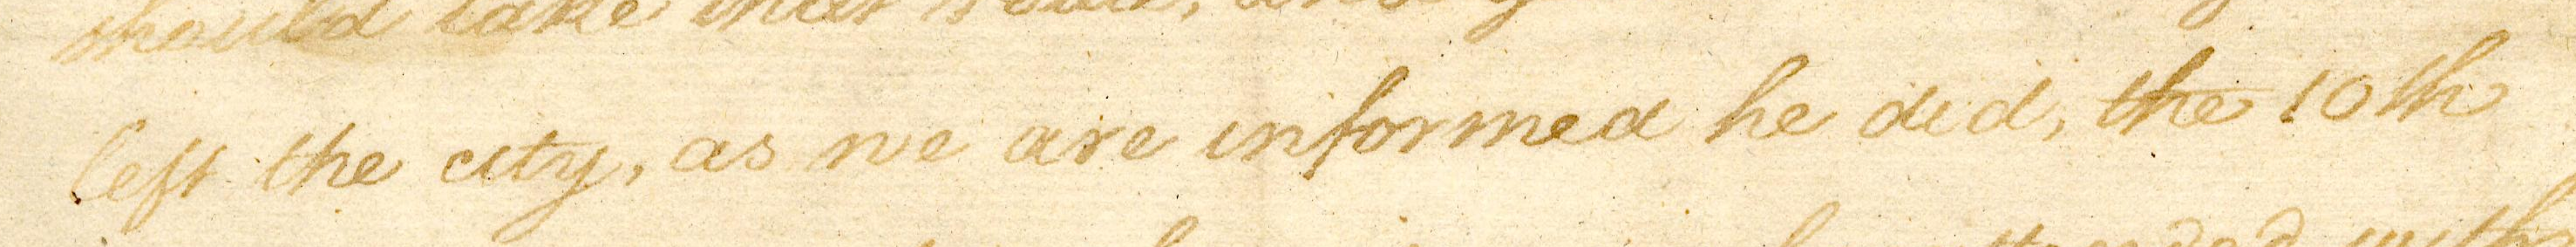left the city, as we are informed he did, the 10th
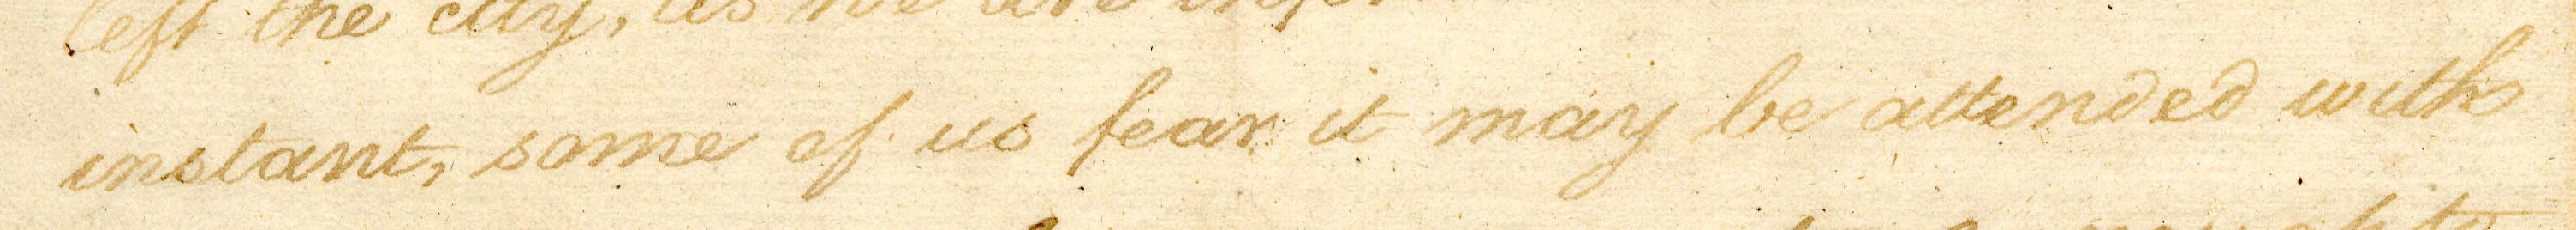instant, some of us fear it may be attended with
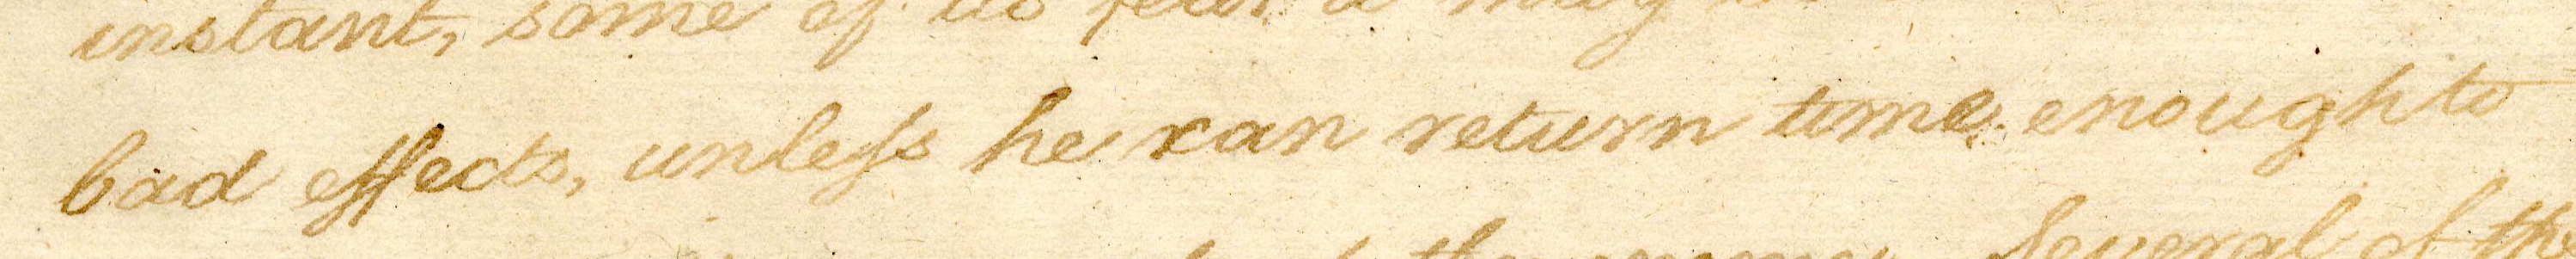bad effects, unless he can return time enough to
